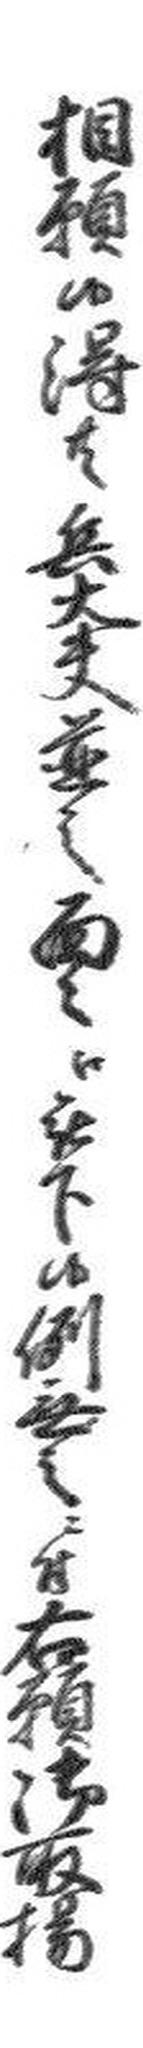相願候得共兵太夫並之面々江被下候例無之ニ付右願御取揚
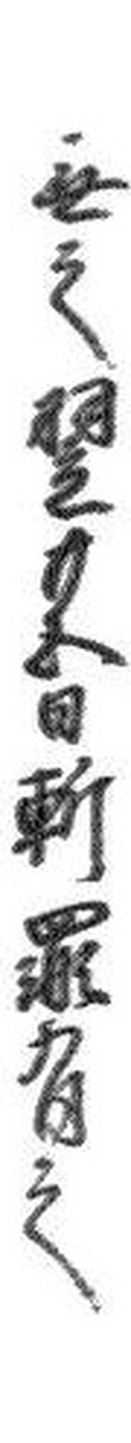無之翌廿五日斬罪有之
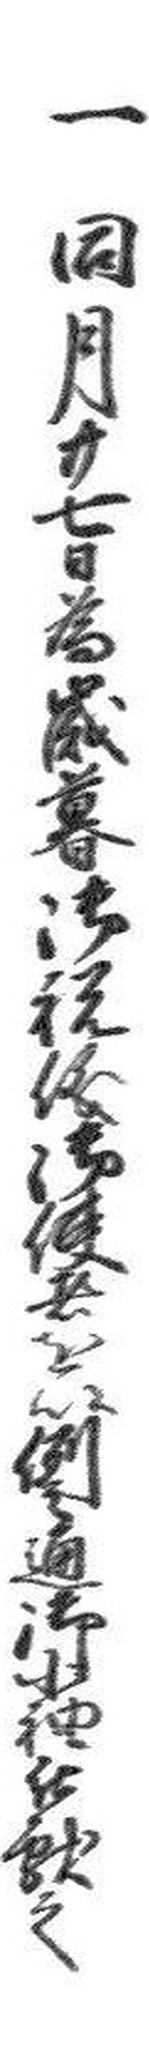一同月廿七日為歳暮御祝儀御使者を以例之通御小袖被献之
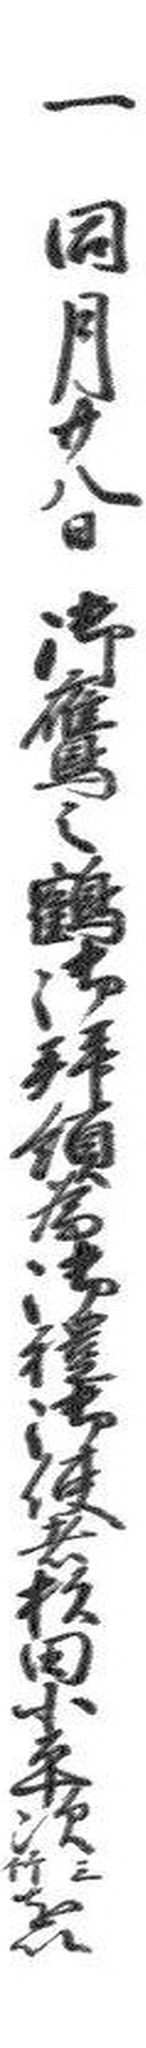一同月廿八日御鷹之鶴御拝領為御礼御使者杉田小平次三竹を以
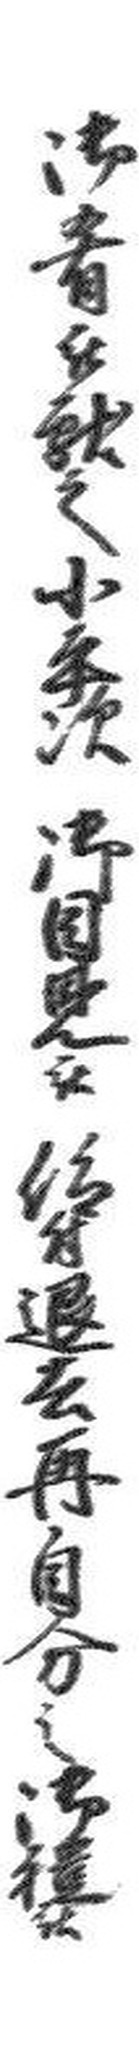御肴被献之小平次御目見被仰付退去再自分之御礼被
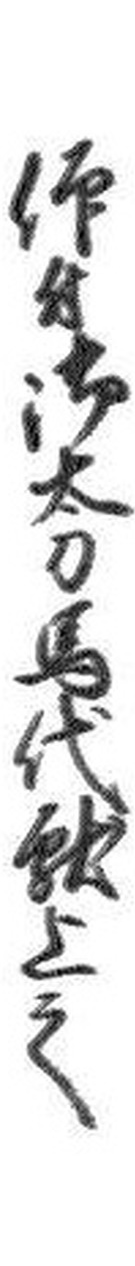仰付御太刀馬代献上之
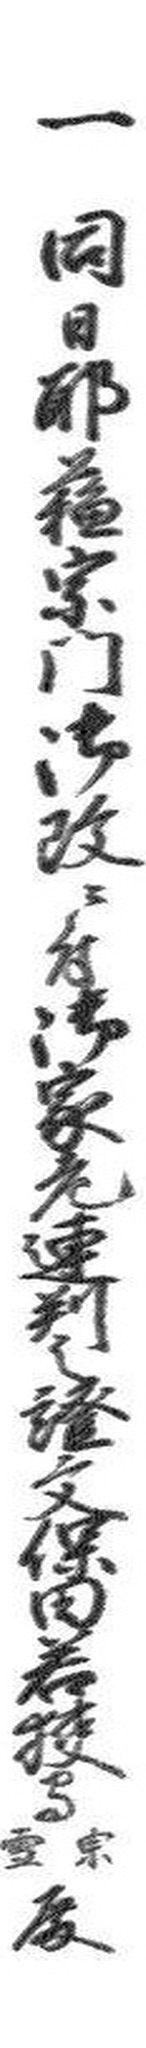一同日耶蘇宗門御改ニ付御家老連判之證文保田若狭守宗雪殿

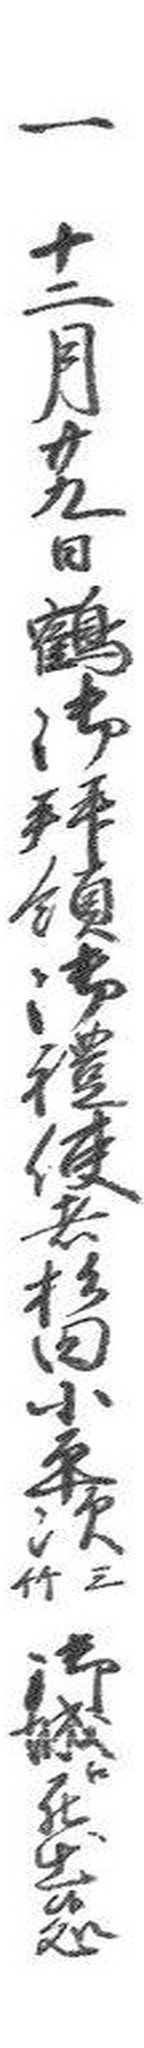一十二月廿九日鶴御拝領御礼使者杉田小平次三竹御城江罷出候処
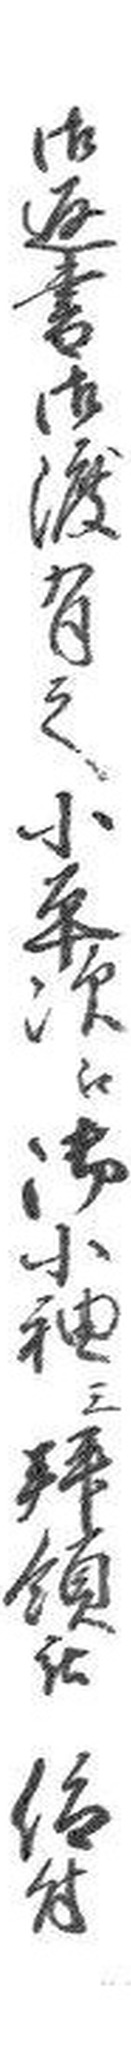御返書御渡有之小平次江御小袖三拝領被仰付
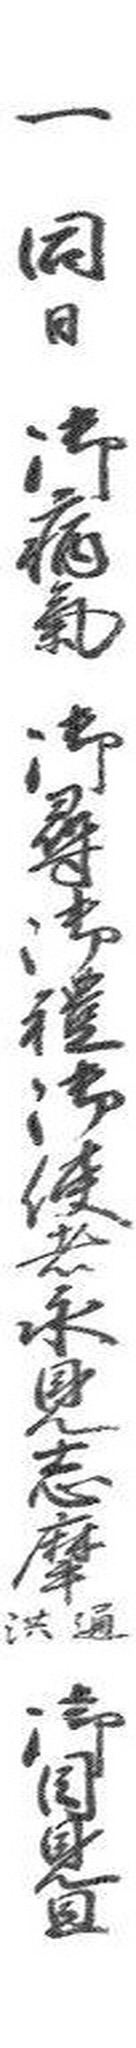一同日御病気御尋御礼御使者永見志摩通洪御目見且
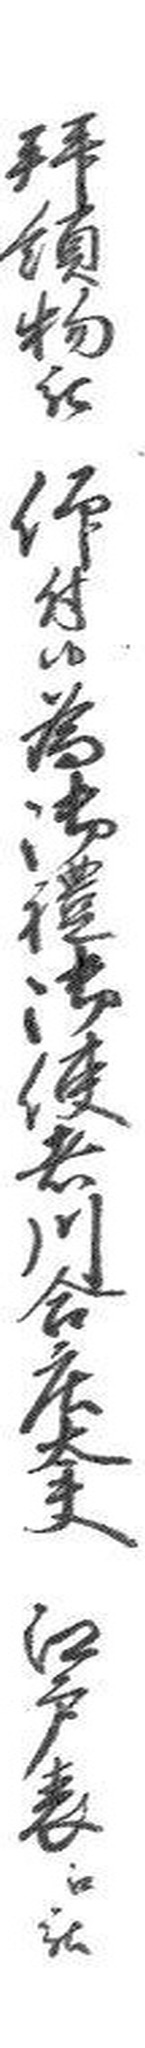拝領物被仰付候為御礼御使者川合庄太夫江戸表江被
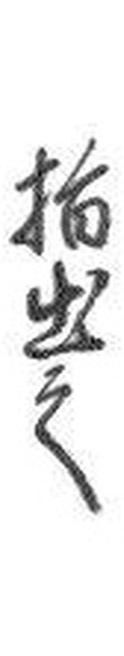指出之
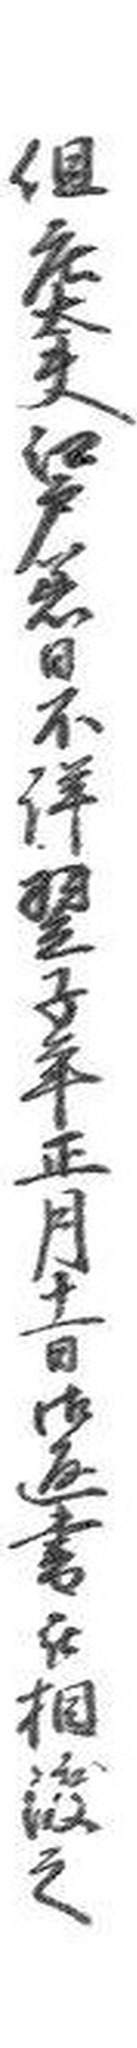但庄太夫江戸着日不詳翌子年正月十一日御返書被相渡之
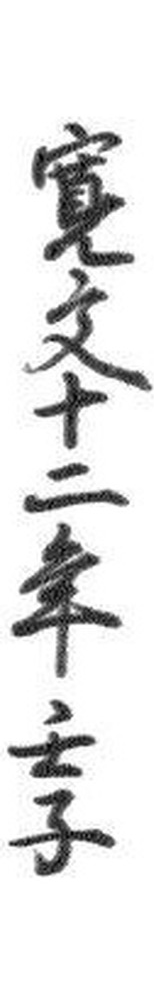寛文十二年壬子
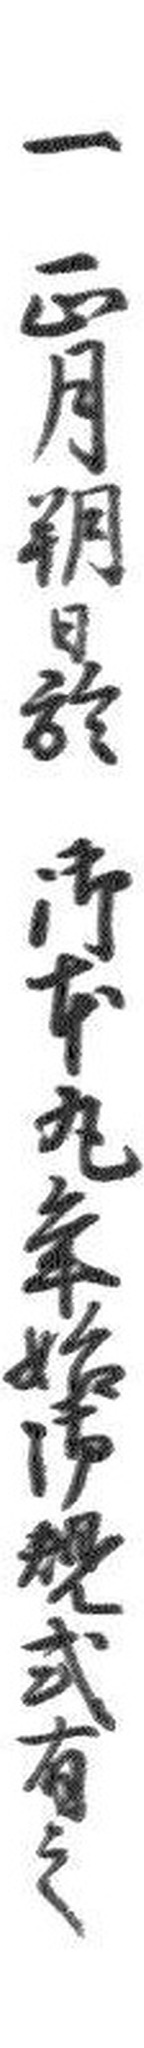一正月朔日於御本丸年始御規式有之
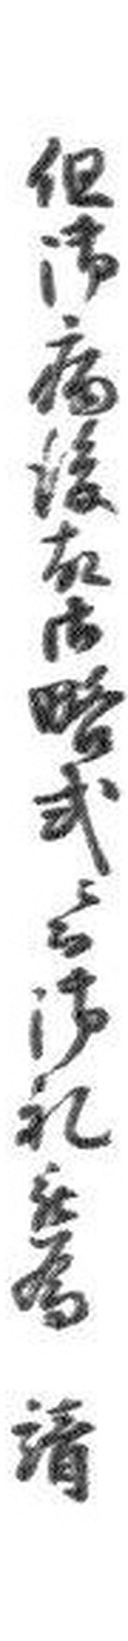但御病後故御略式ニ而御礼被為請
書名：家譜 八 光通公 従寛文十年到同十二年
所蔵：福井県文書館 Fukui Prefectural Archives
